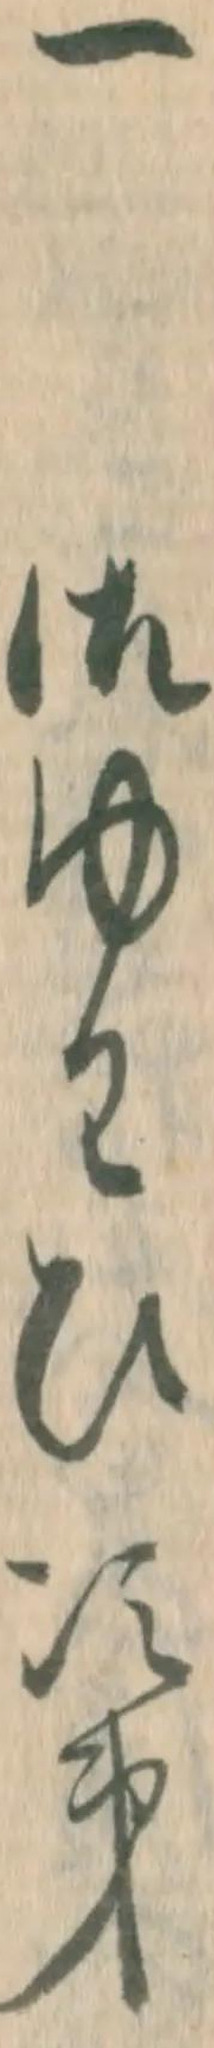一御ゆわひ次第
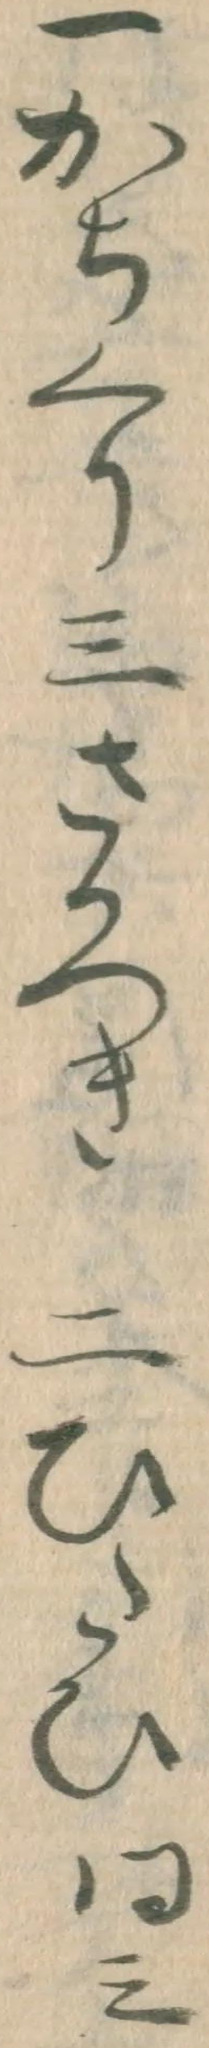一かちくり三さかつき二ひたひ同三
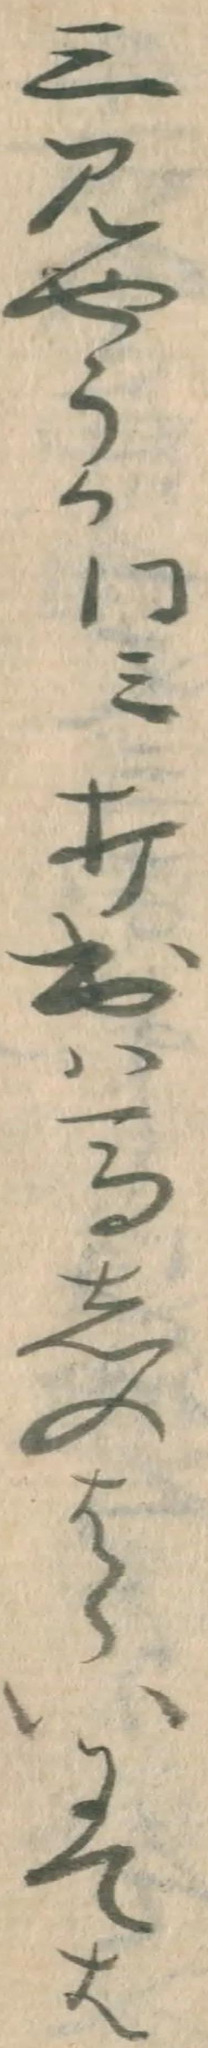三みやうか同三打出は馬しのはらいにては
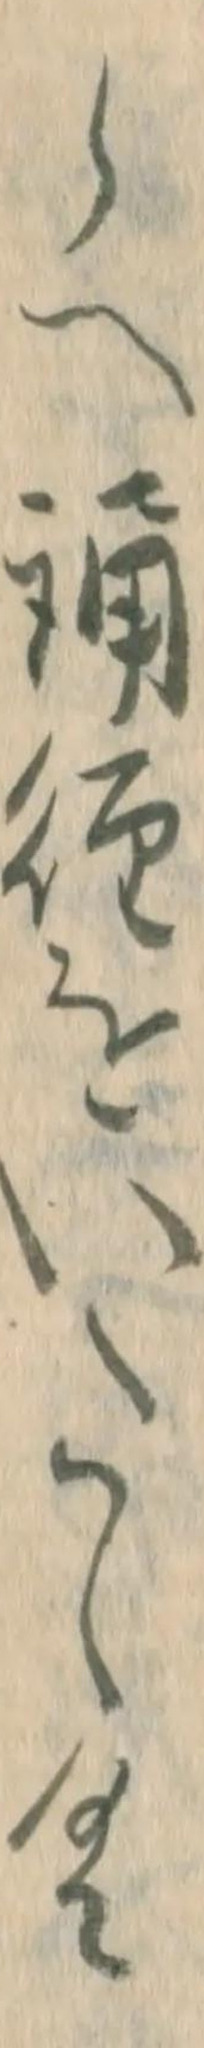らへ誦経をいたゝく
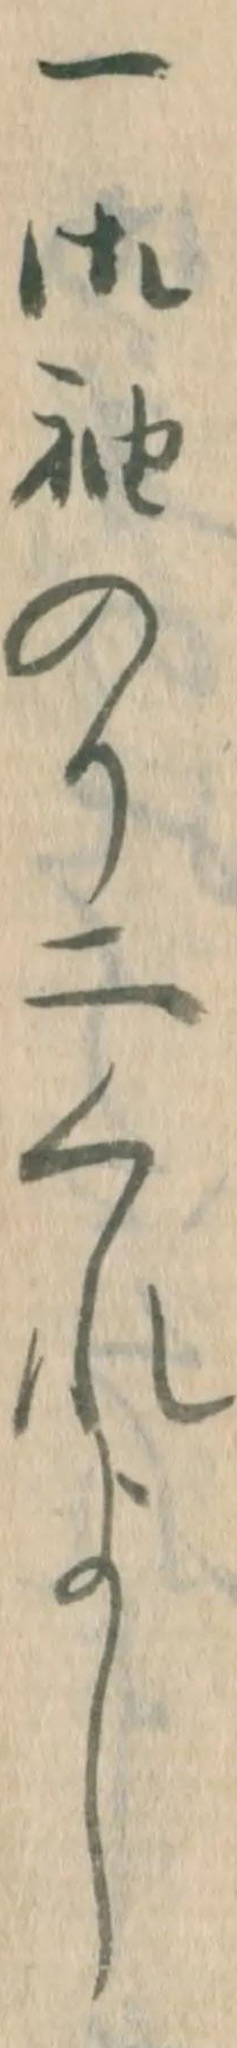一御袖のり二くれよし

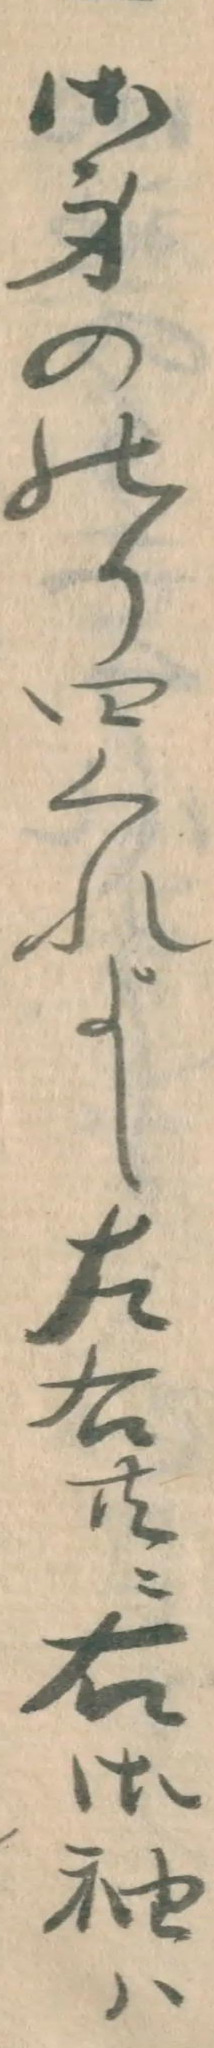一御身ののり四くれよし左右共に右御袖は
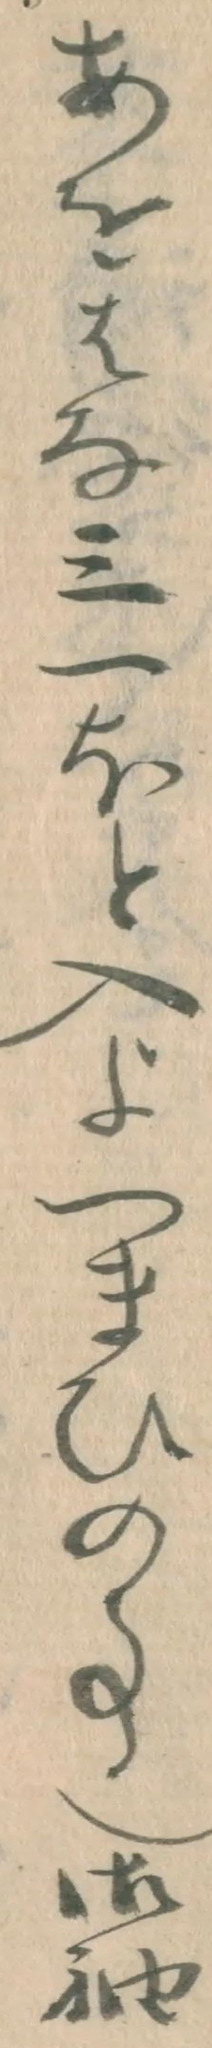あをはな三一ほと入よつまひの事也御袖
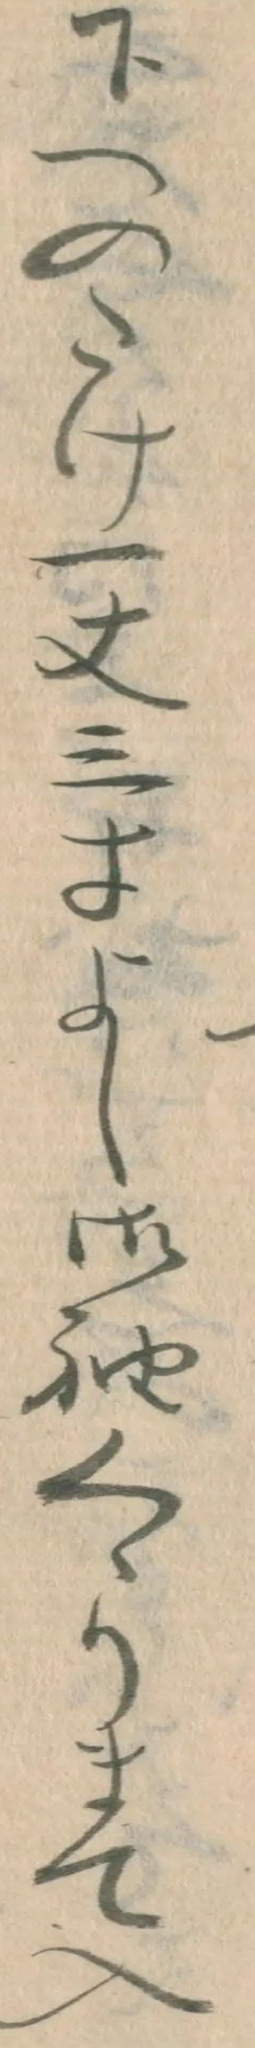下へのたけ一丈三寸よし御袖くゝりまて入
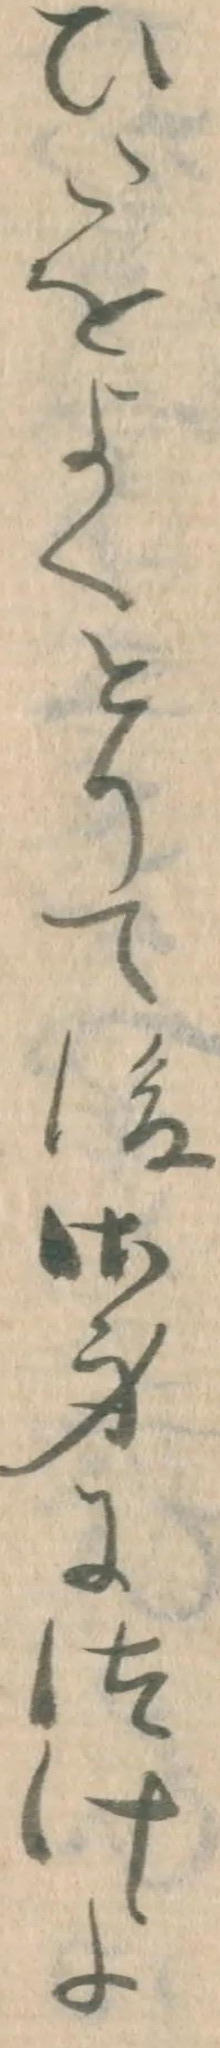ひたをよくとりて後御身につけよ
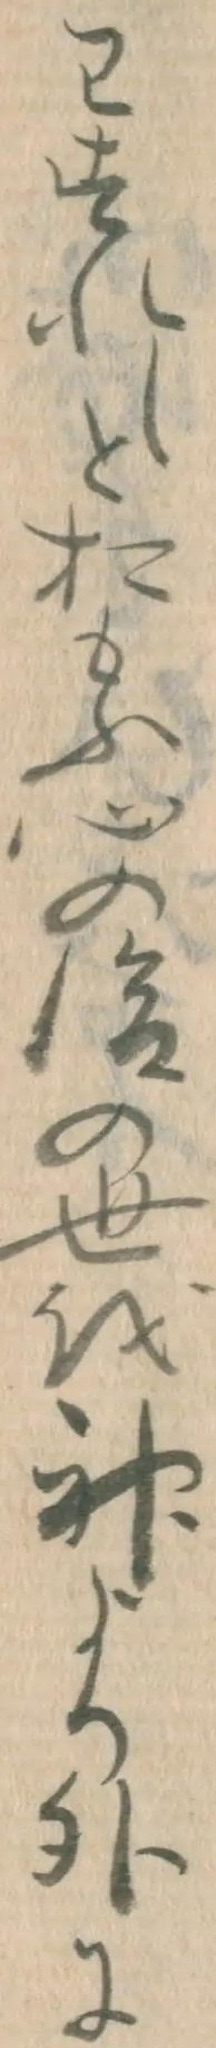わすれしとおもふ心の後の世を神より外に
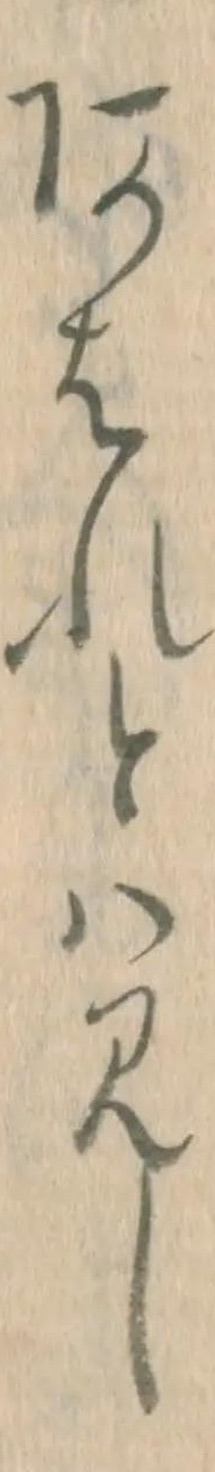あはれとは見し
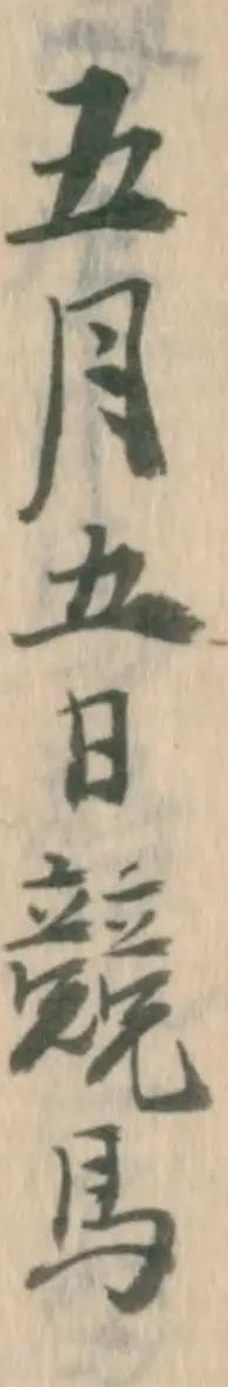五月五日競馬
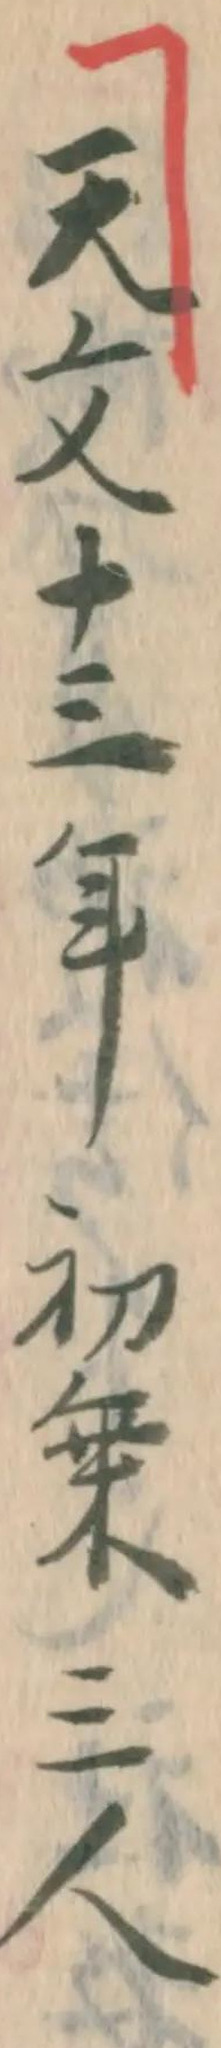天文十三年初乗三人
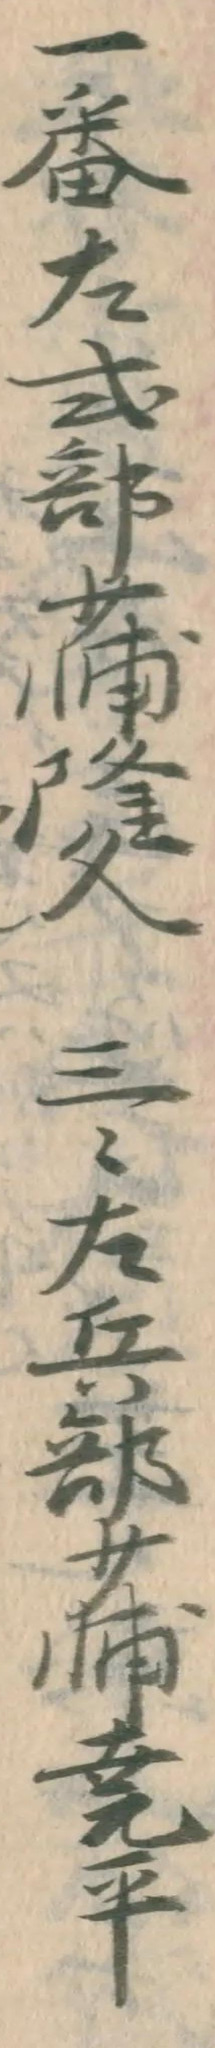一番左式部少輔隆文三々左兵部少輔堯平
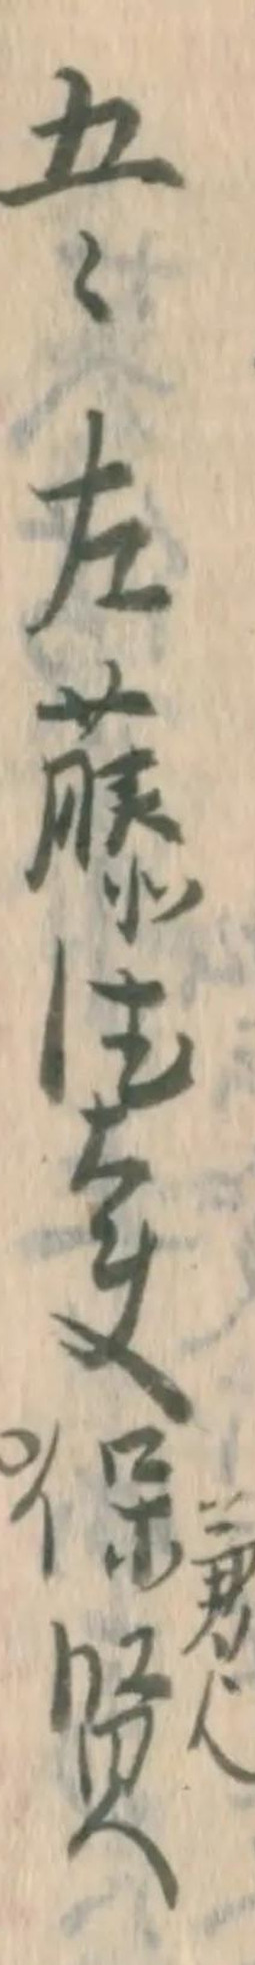五々左藤徳大夫◦保賢
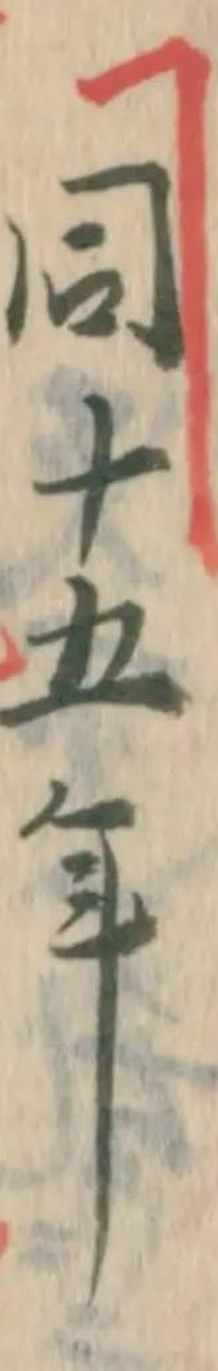同十五年
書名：賀茂社記録. 第10冊
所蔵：国立国会図書館 National Diet Library, JAPAN
